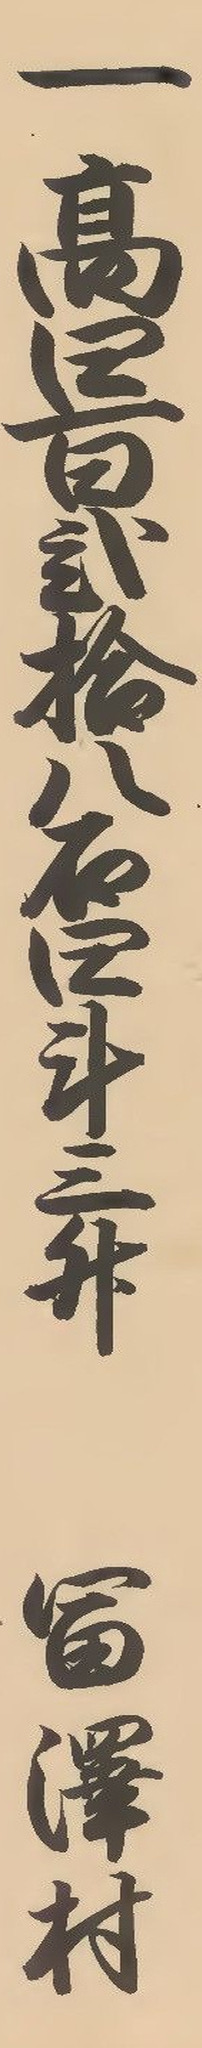一髙四百弐拾八石四斗三升冨澤村
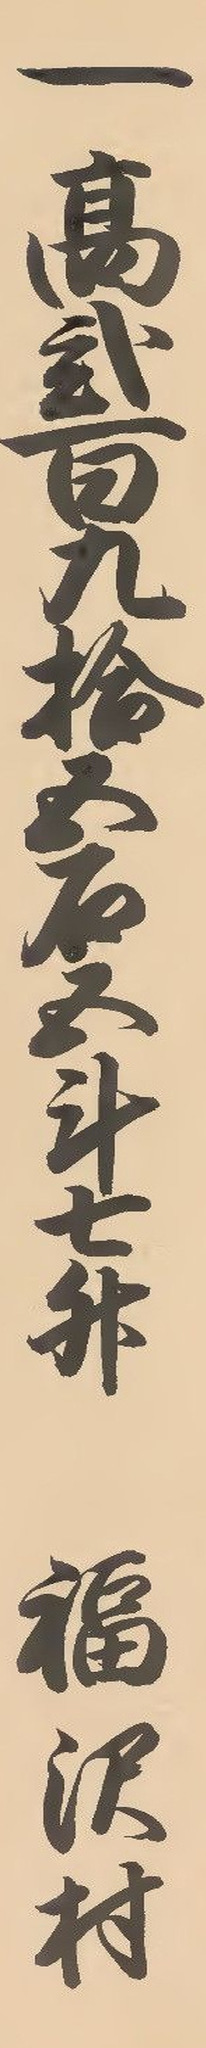一髙弐百九拾五石五斗七升福沢村
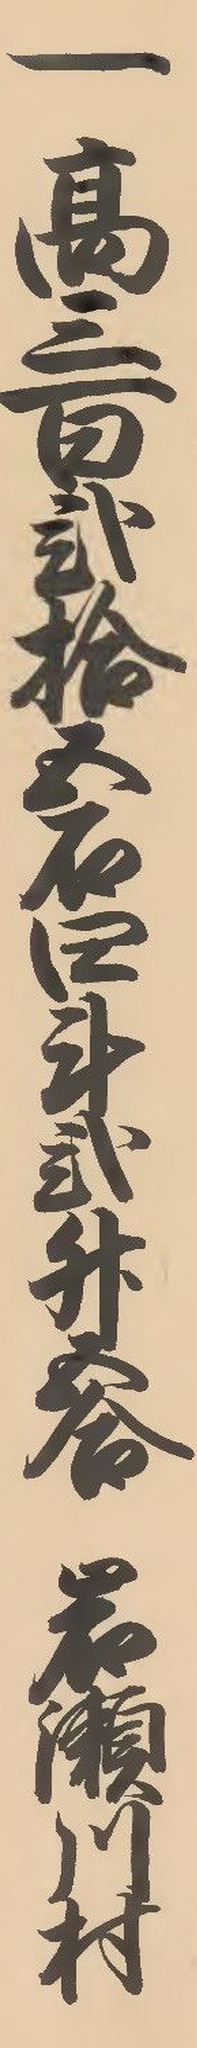一髙三百弐拾五石四斗弐升五合岩瀬川村
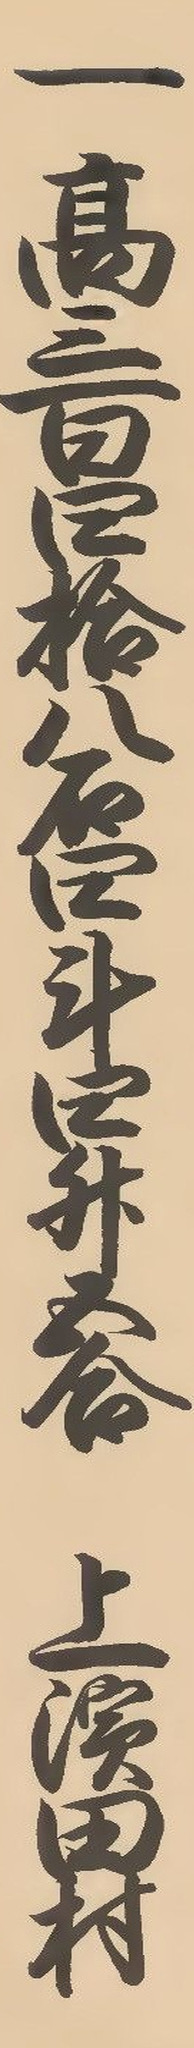一髙三百四拾八石四斗四升五合上濱田村
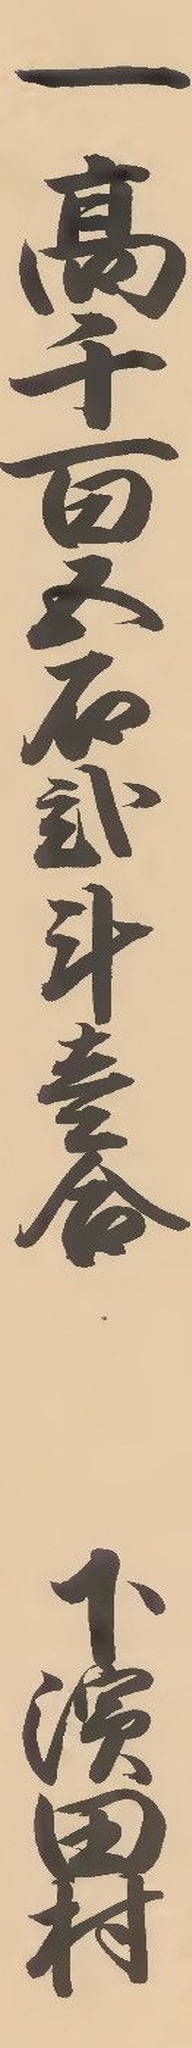一髙千百五石弐斗壱合下濱田村

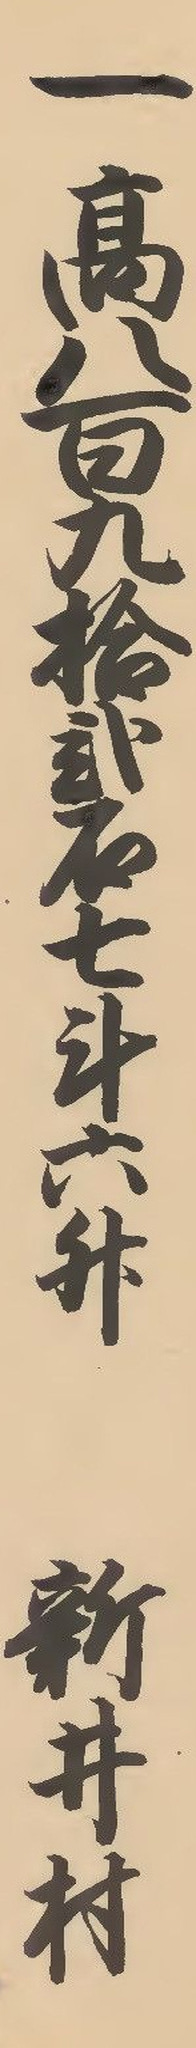一髙八百九拾弐石七斗六升新井村
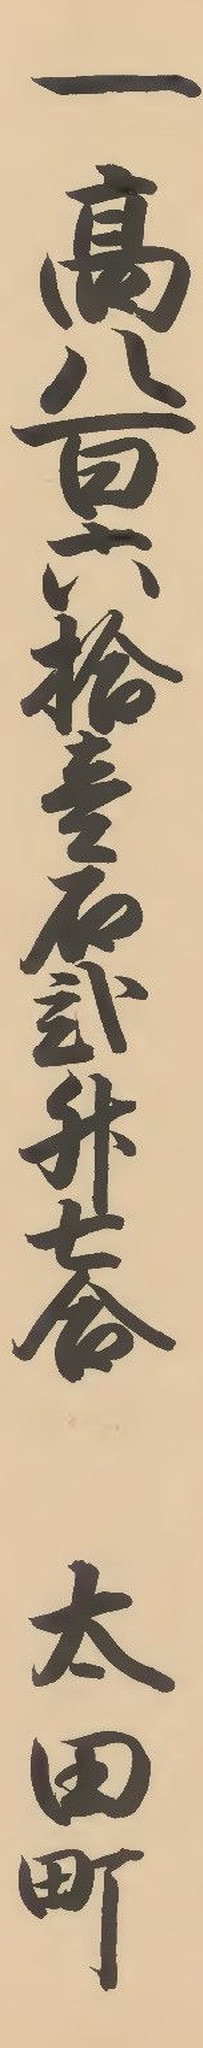一髙八百六拾壱石弐升七合太田町
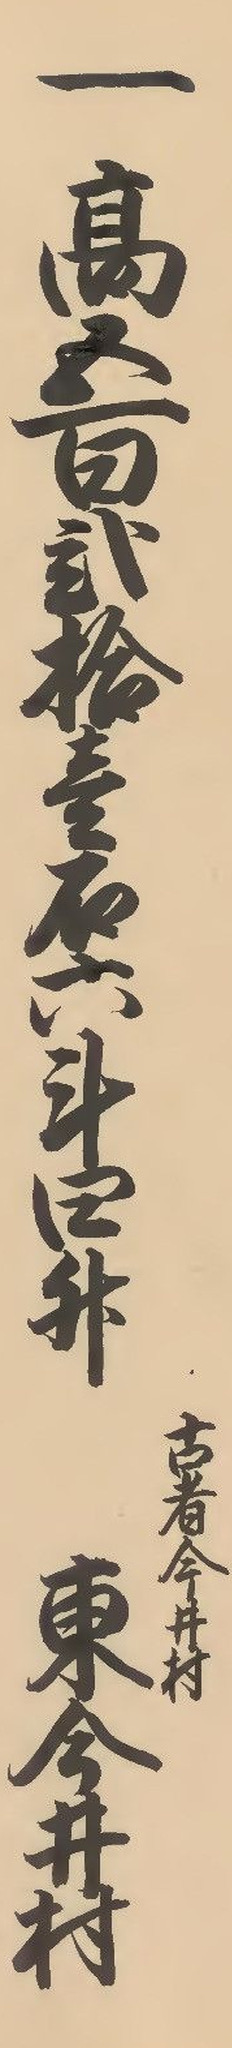一髙五百弐拾壱石六斗四升東今井村
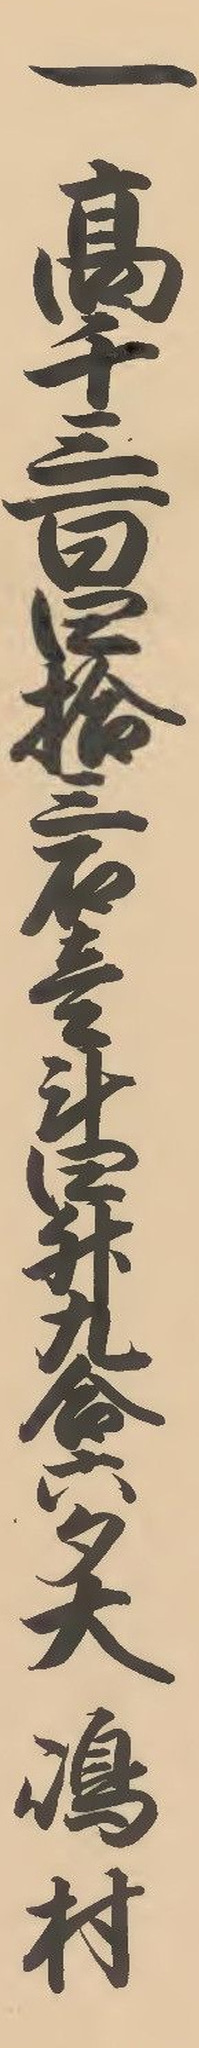一髙千三百四拾三石壱斗四升九合六夕大嶋村
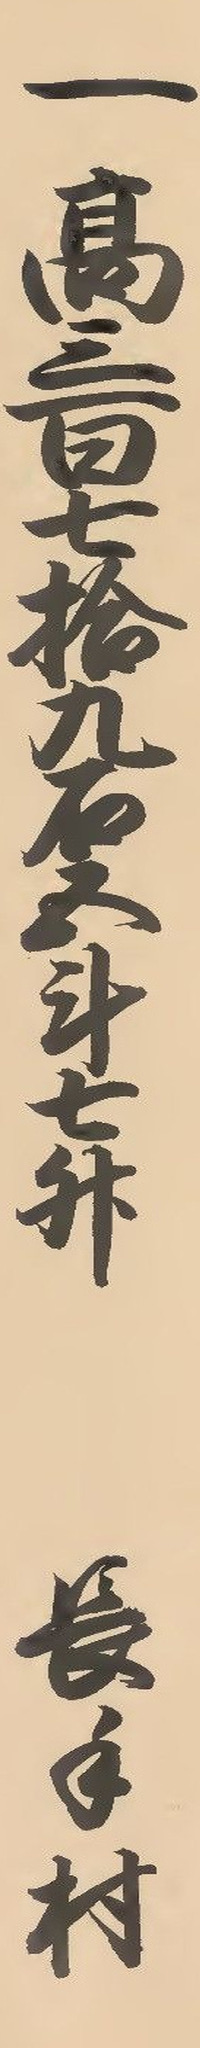一髙三百七拾九石五斗七升長手村
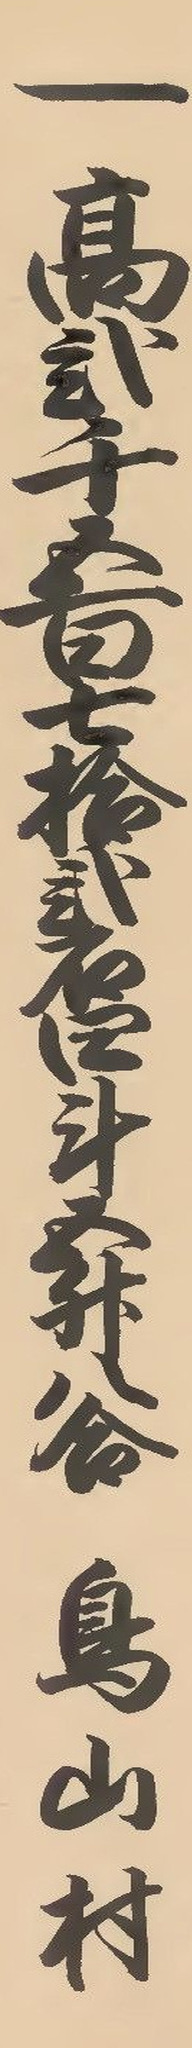一髙弐千五百七拾弐石四斗五升八合鳥山村
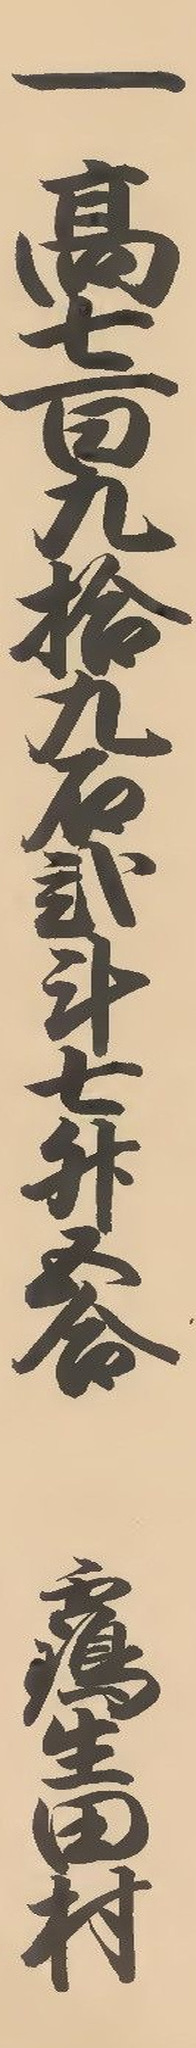一髙七百九拾九石弐斗七升五合鶴生田村
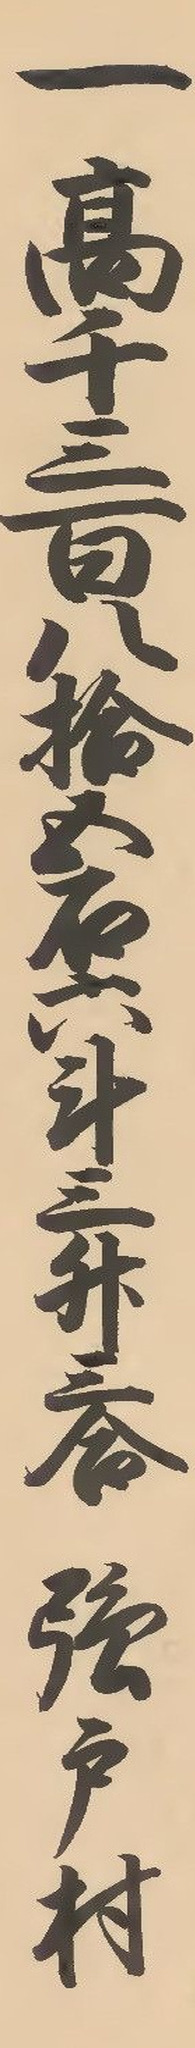一髙千三百八拾五石六斗三升三合強戸村

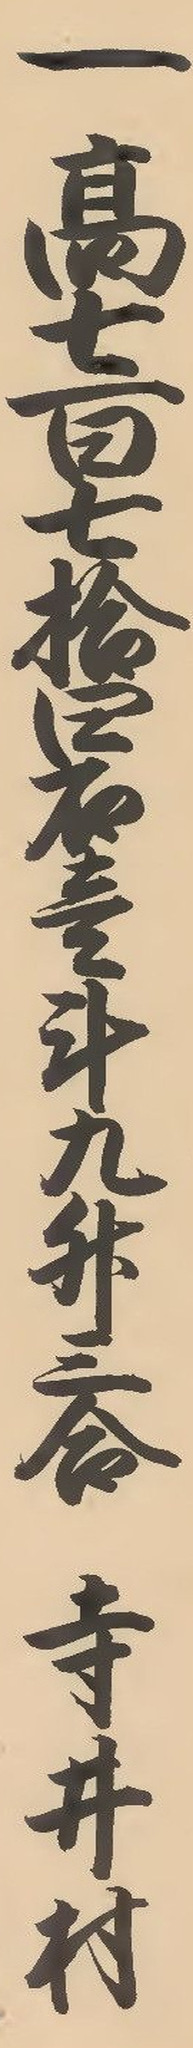一髙七百七拾四石壱斗九升三合寺井村
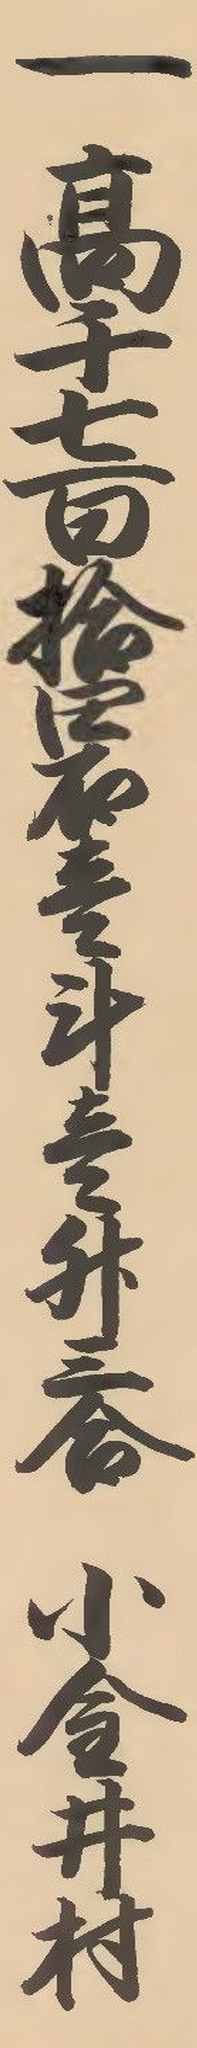一髙千七百拾四石壱斗壱升三合小金井村
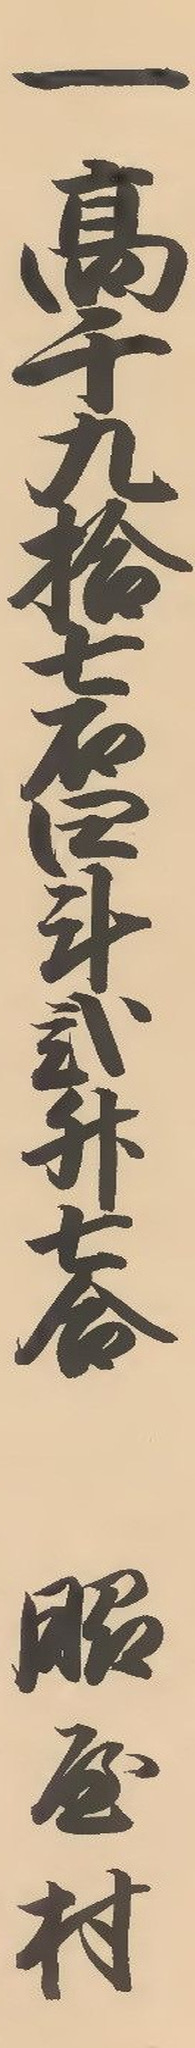一髙千九拾七石四斗弐升七合脇屋村
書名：上野国郷帳
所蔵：国立公文書館 National Archives of Japan
